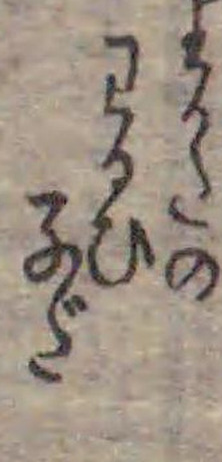わるひ

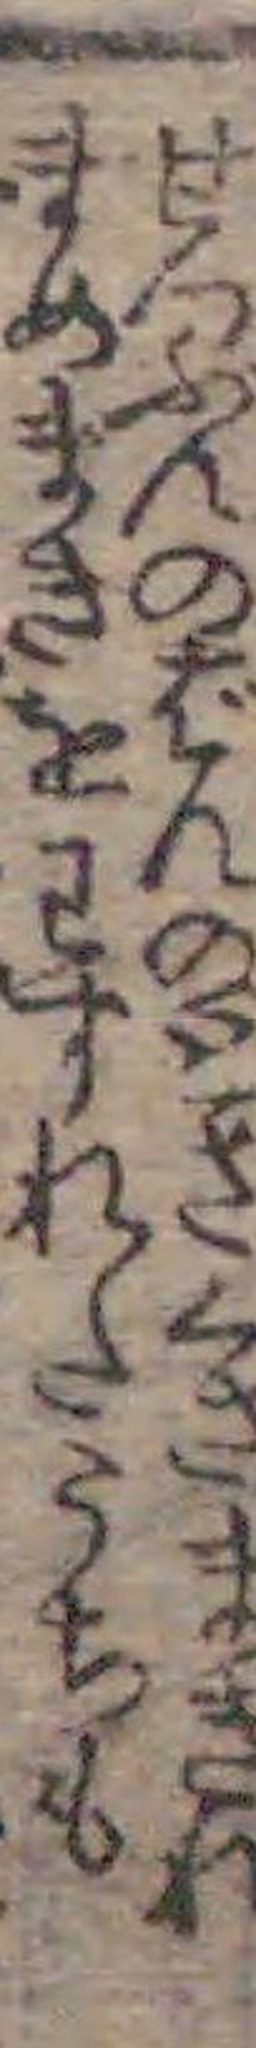まめまきをわすれたうちも
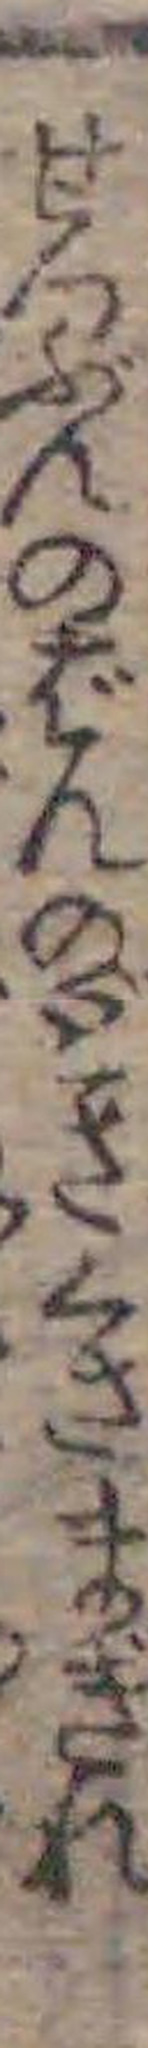せつぶんのばんのどさくさまぎれ
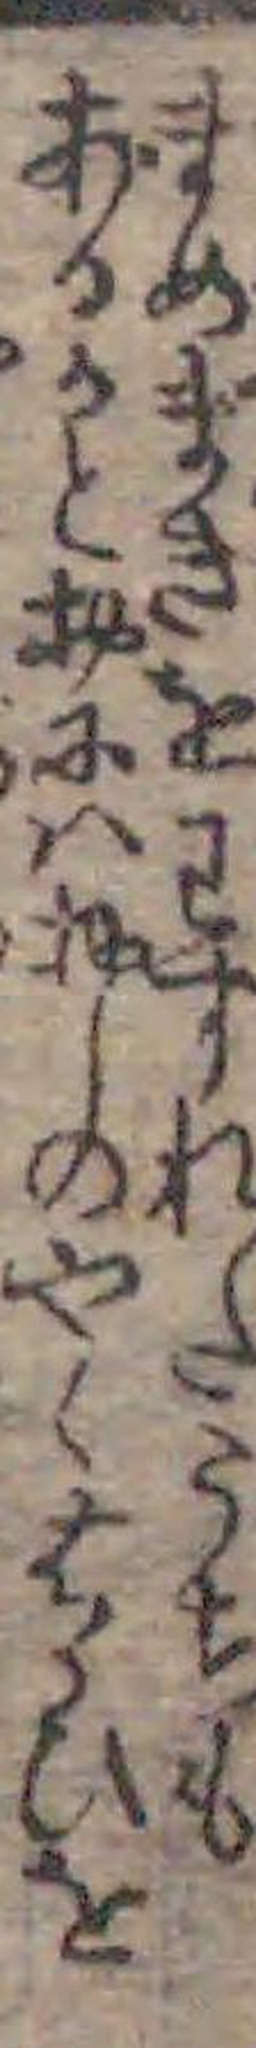あるかとおにはおしのやくはらひを
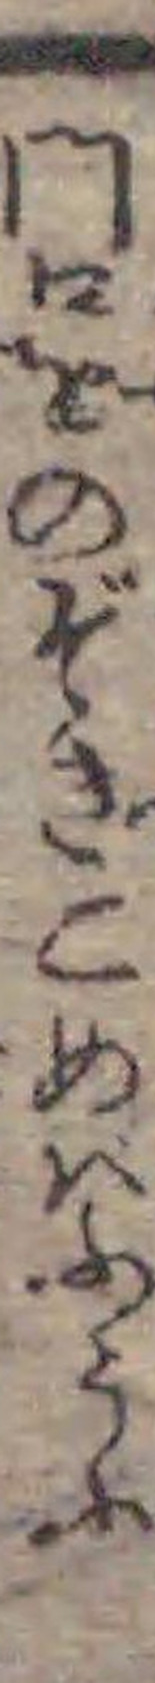門口をのぞきこめばふうふ
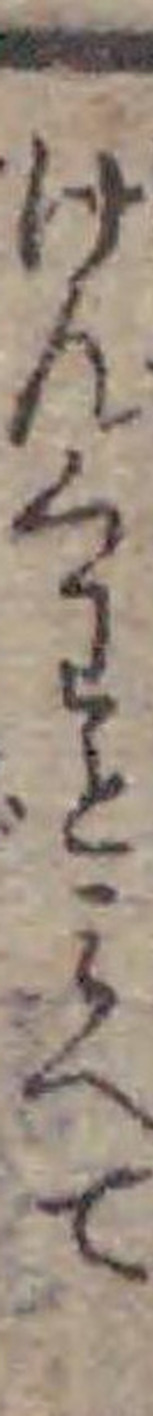けんくわとみへて
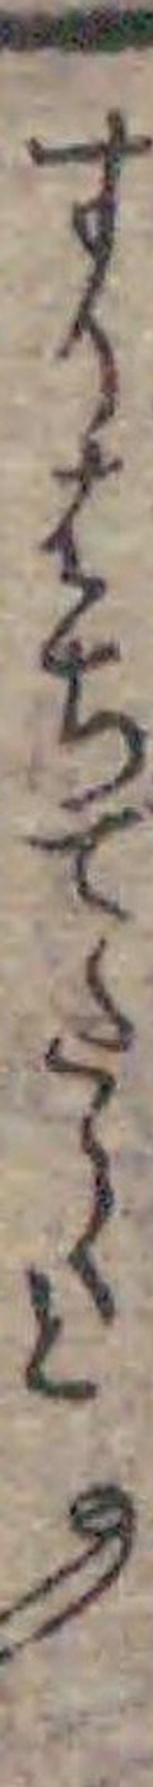すりはちでたゝくと
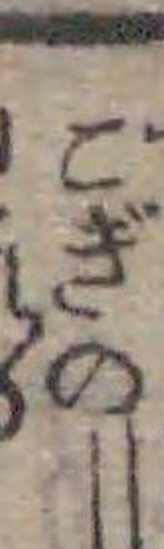こぎの
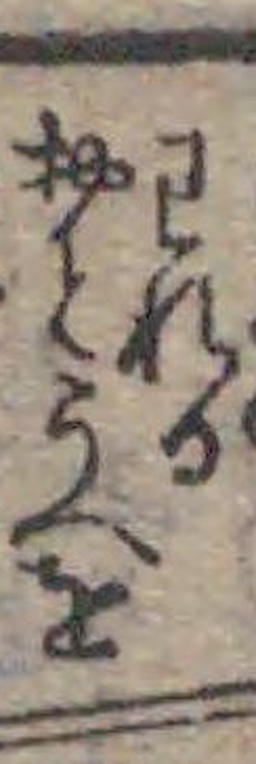おとうへを
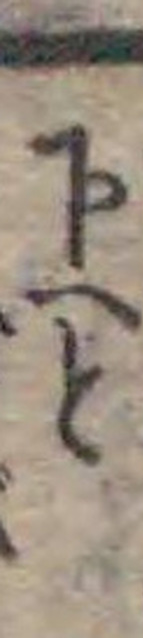下へと
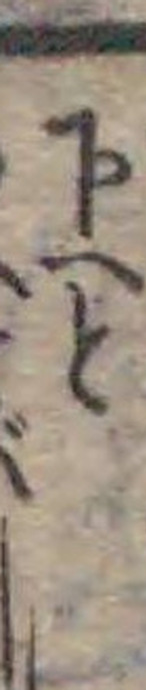下へと
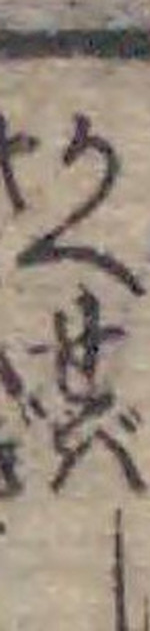かへせば
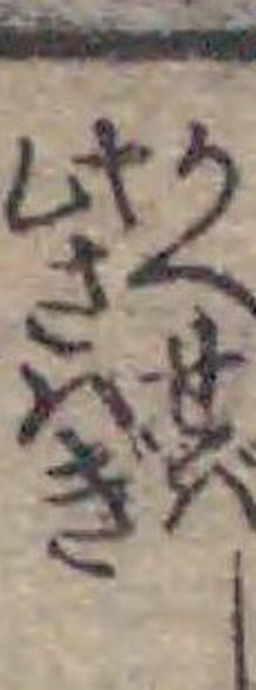此さはぎ
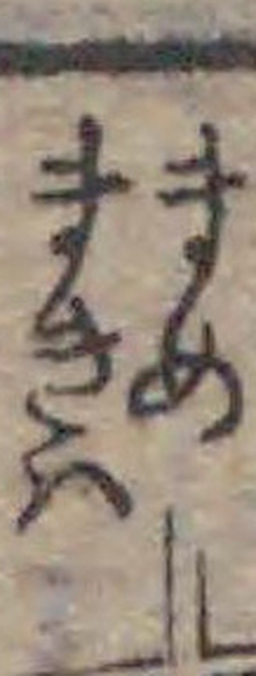まきは
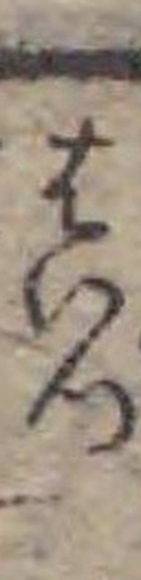はいつ
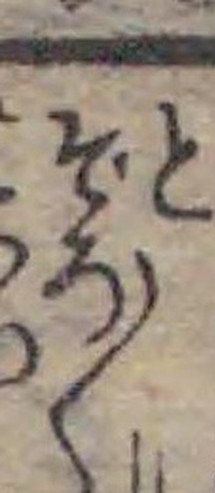ぞろ〳〵
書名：怪物つれつれ草 : 2巻
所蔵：国立国会図書館 National Diet Library, JAPAN
